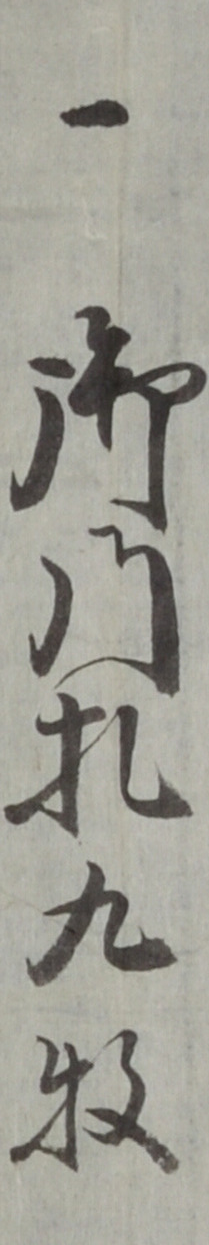一御門札九枚
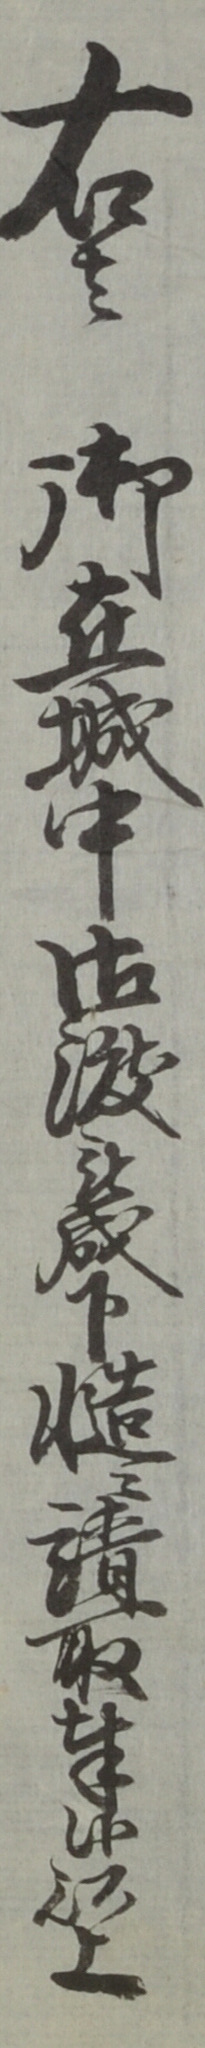右者御在城中御渡被成下慥ニ請取奉候以上
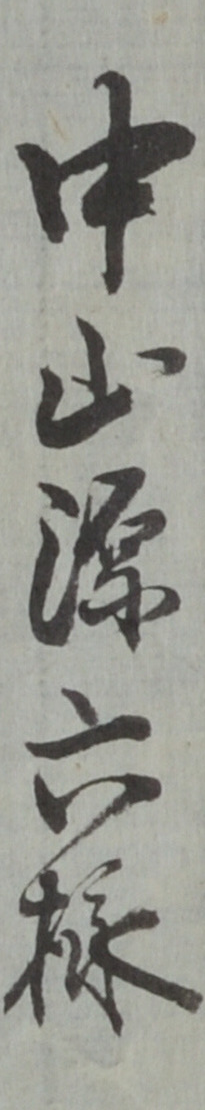中山源六様
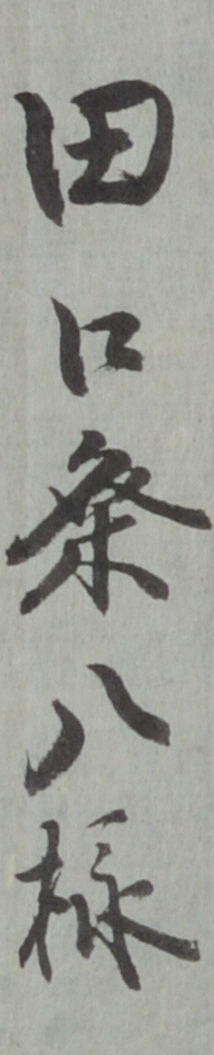田口粂八様
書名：覚
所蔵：伊那市立高遠町図書館・合同会社AMANE
